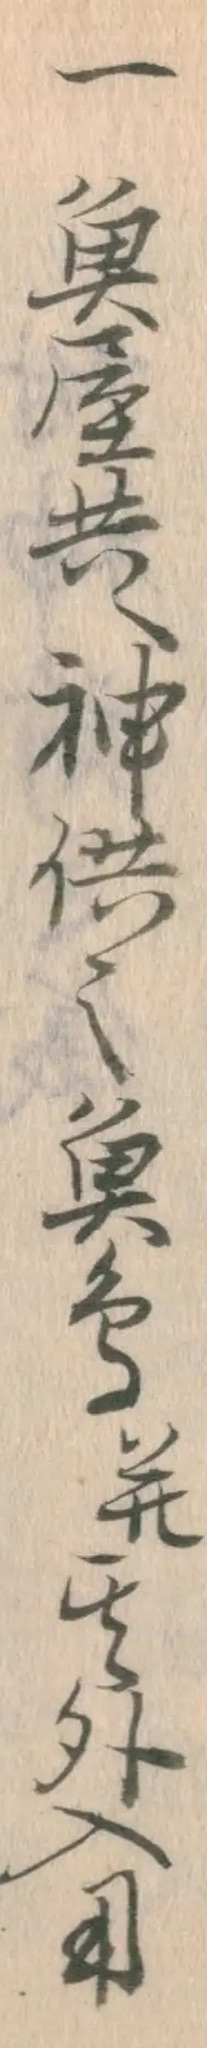一魚屋共へ神供之魚鳥并其外入用
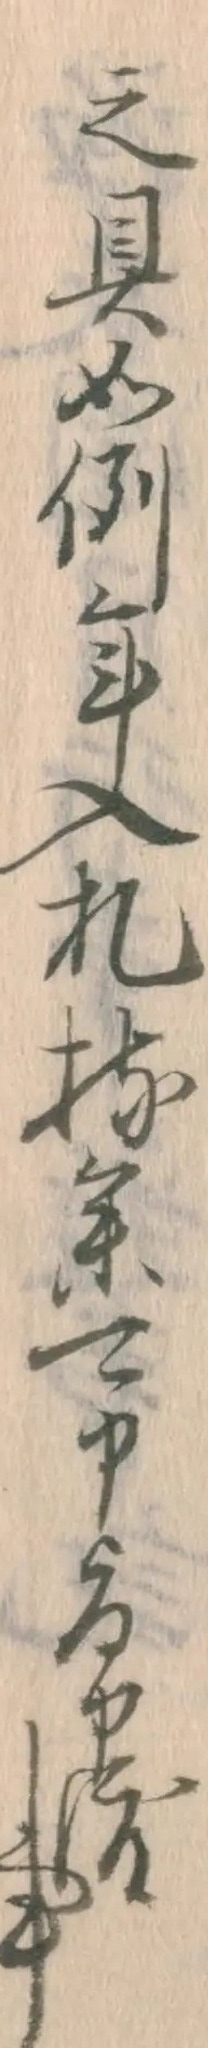之具如例年入札持参可申旨申渡事
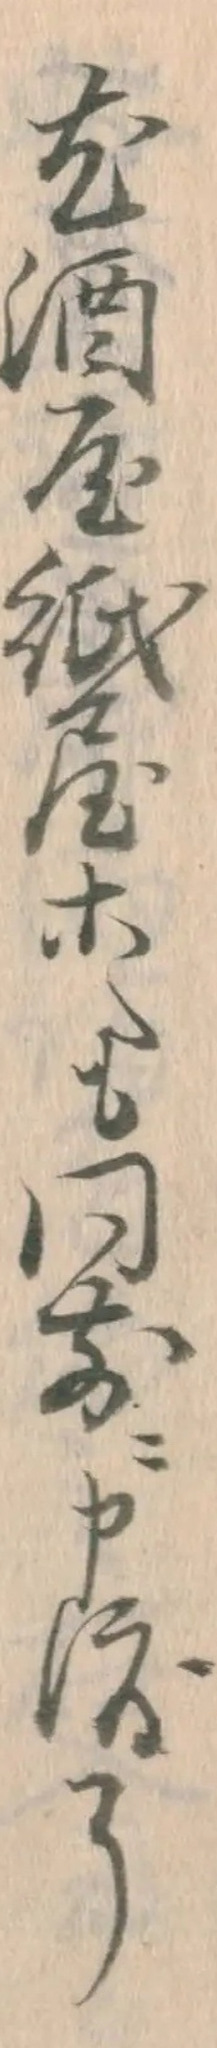尤酒屋紙屋等へも同前に申渡了
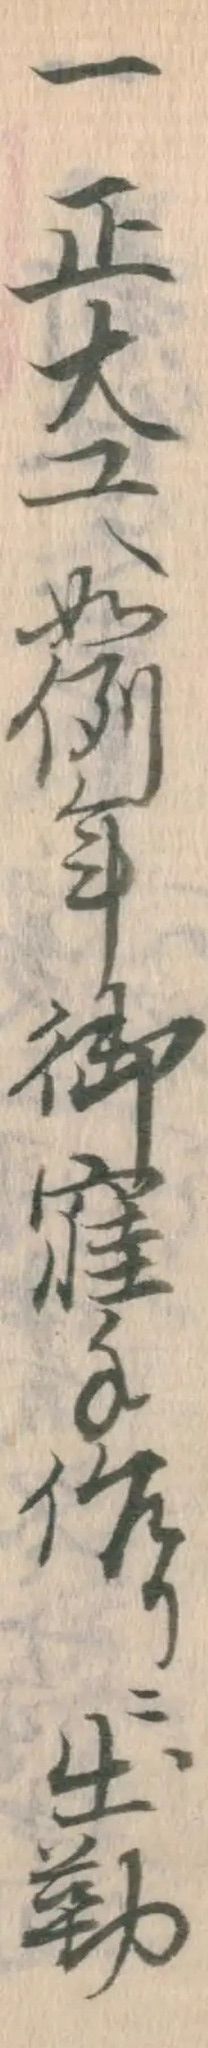一正大工へ如例年御窪手作りに出勤
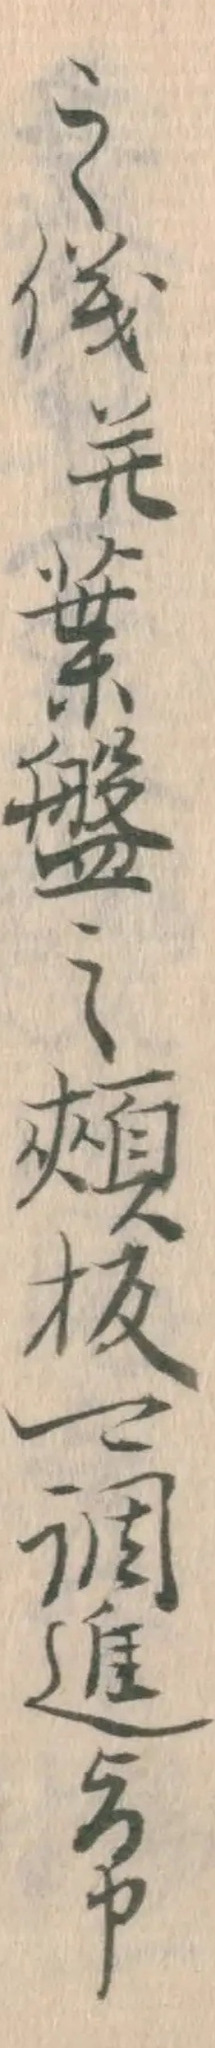之儀并葉盤之頬板可調進旨申
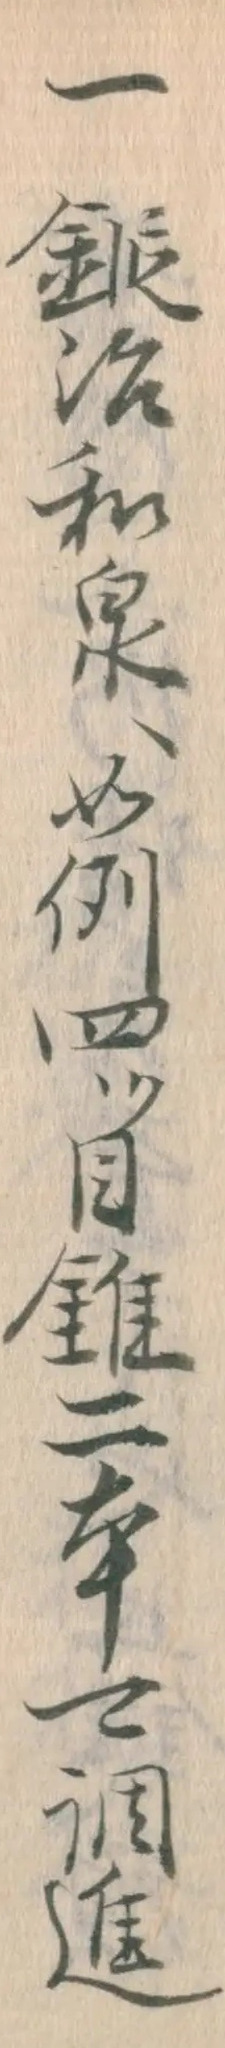一鍛冶和泉へ如例四ツ目錐二本可調進
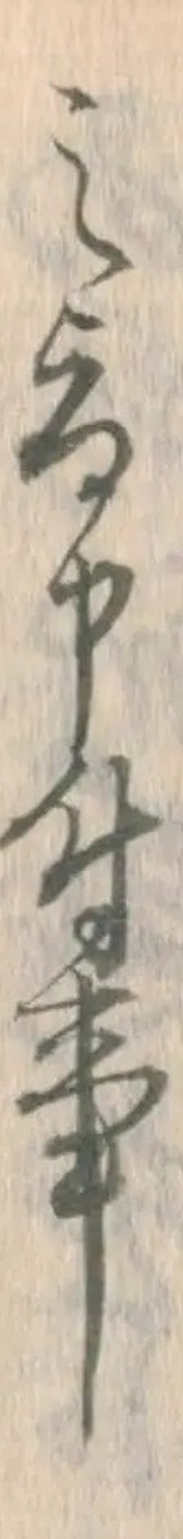之旨申付事
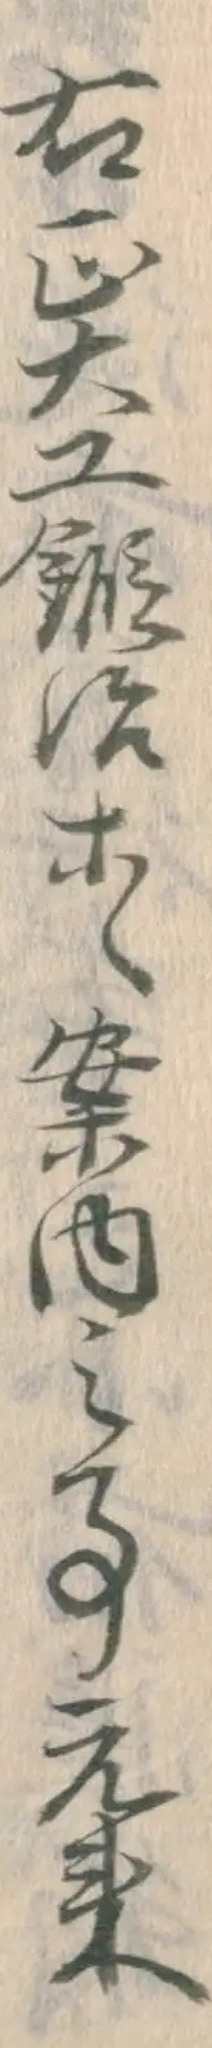右正大工鍛冶等へ案内之事元来
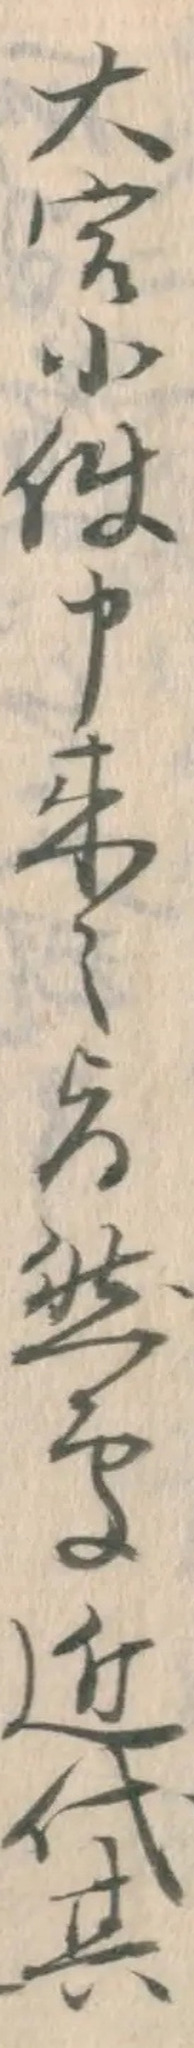大宮小使申来之旨然処近代其
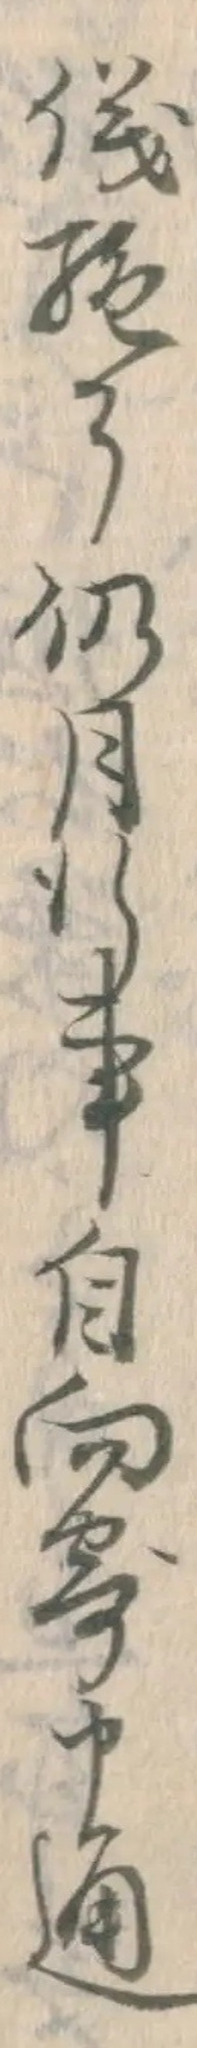儀絶了仍月行事自向寄申通
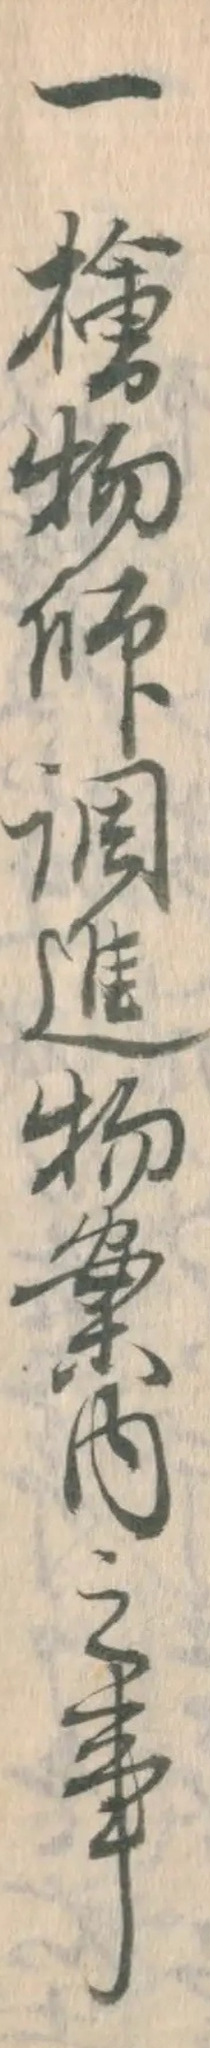一桧物師調進物案内之事
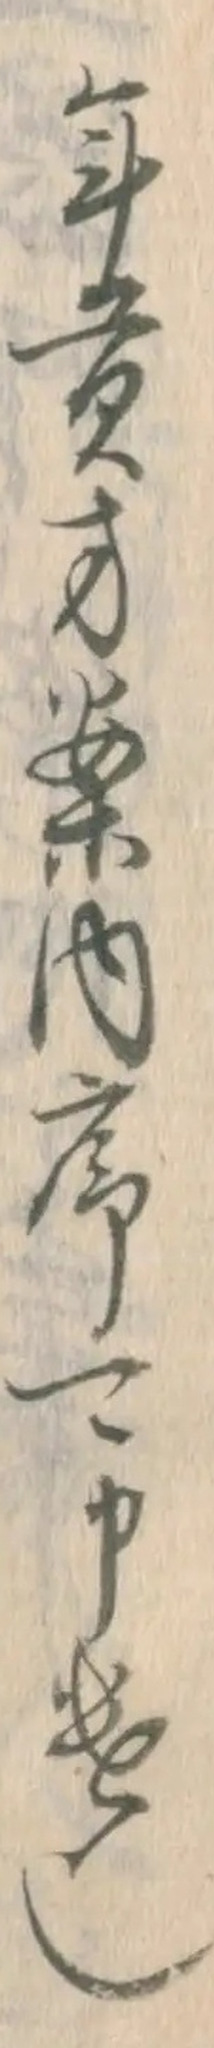年貢方案内序可申遣也

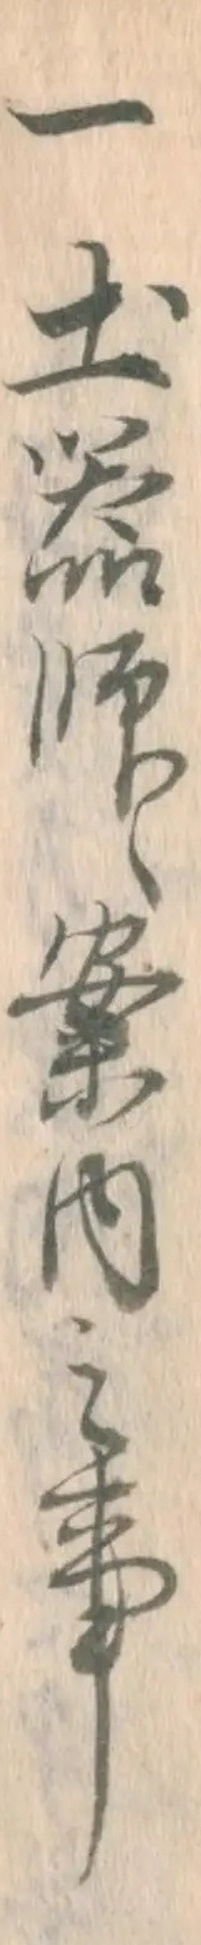一土器師へ案内之事
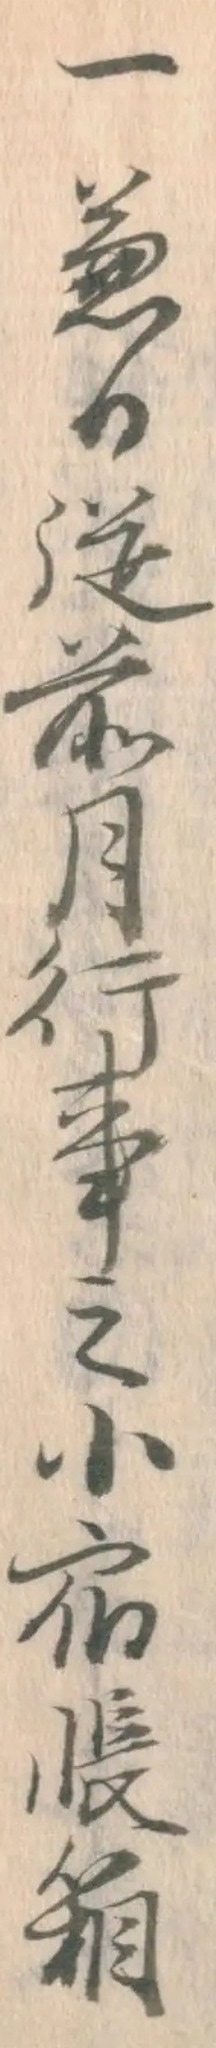一兼日従前月行事之小宿帳箱
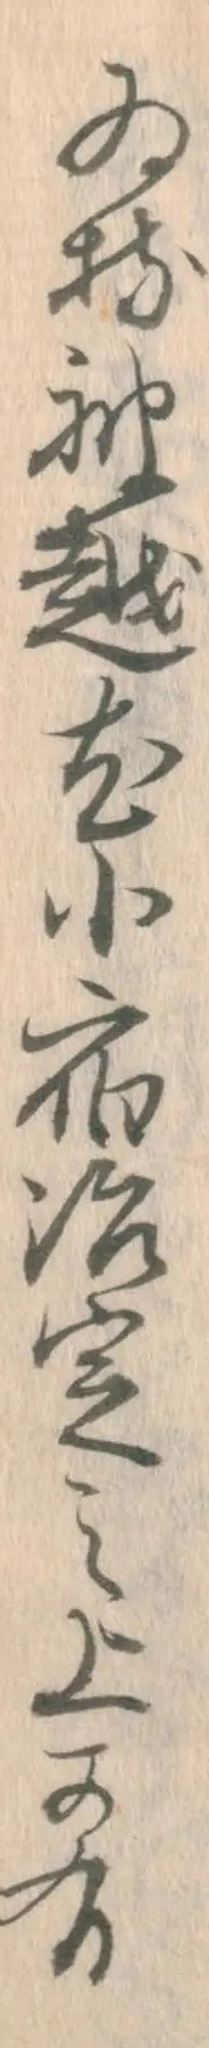為持被越尤小宿治定之上可有
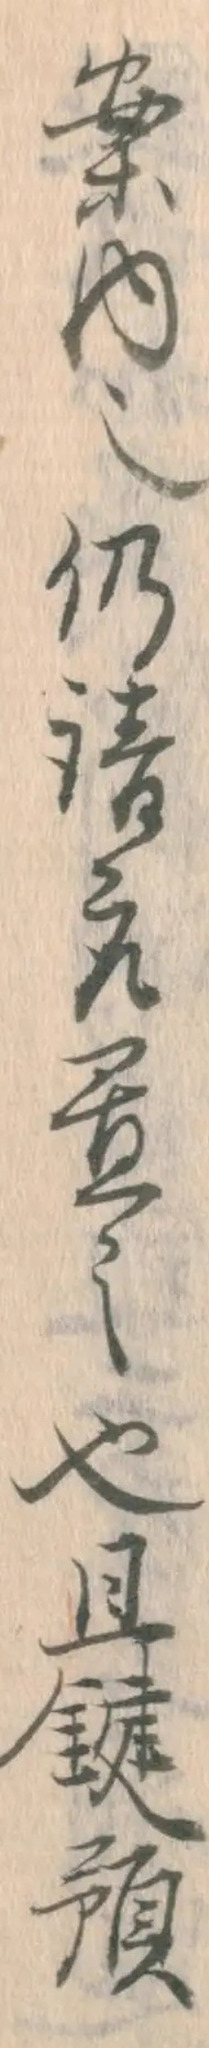案内也仍請取置之也且鍵預
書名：賀茂社記録. 第81冊
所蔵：国立国会図書館 National Diet Library, JAPAN
